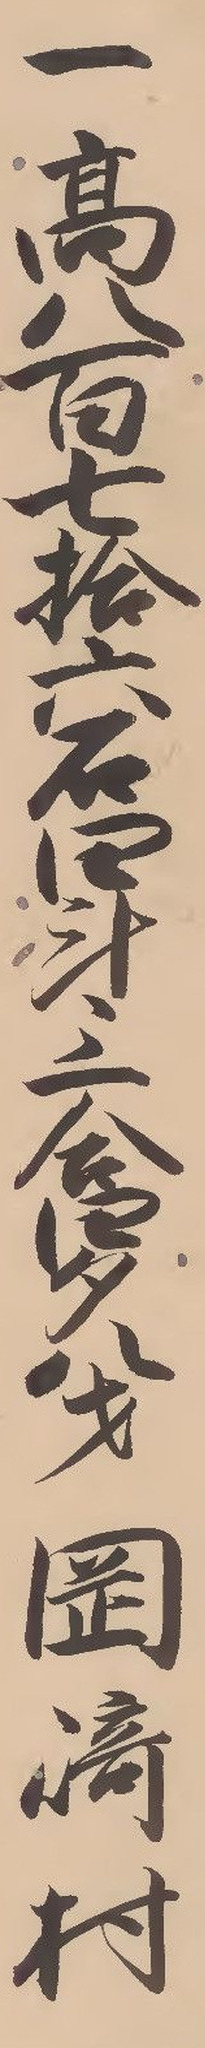一高八百七拾六石四斗三合四勺八才岡崎村
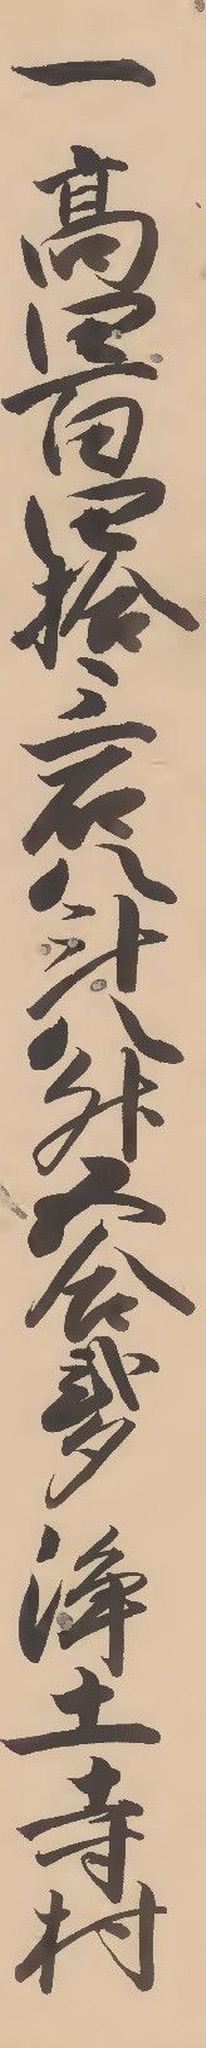一高四百四拾三石八斗八升五合弐勺浄土寺村
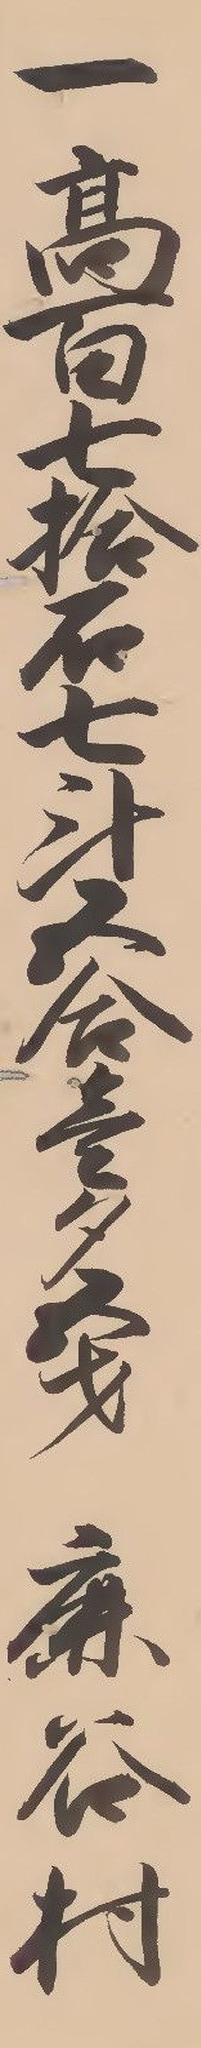一高百七拾石七斗五合壱勺五才鹿谷村
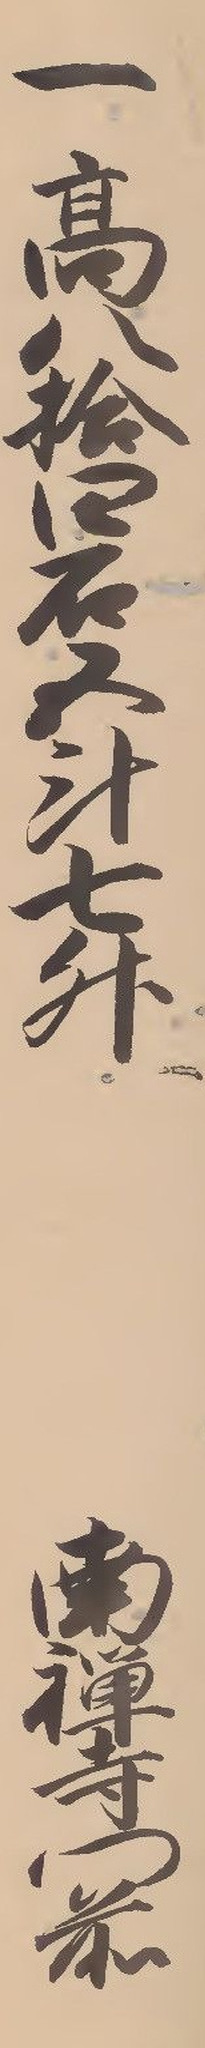一高八拾四石五斗七升南禅寺門前
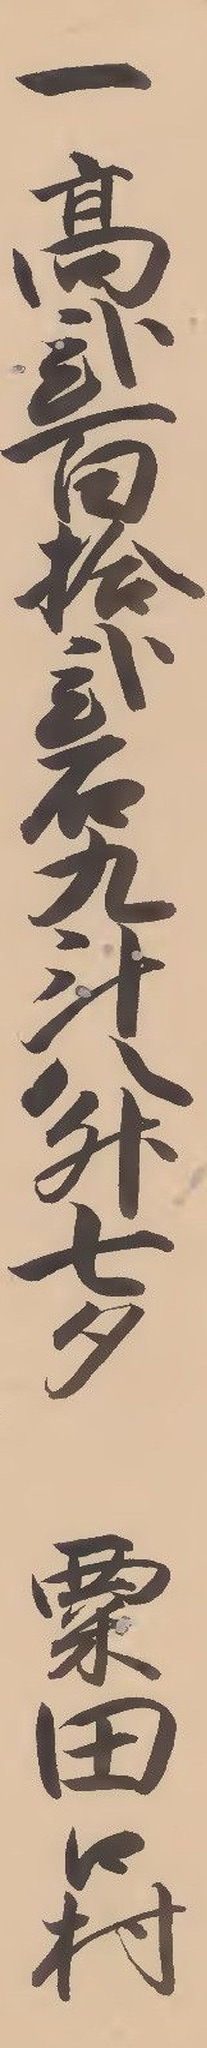一高弐百拾弐石九斗八升七勺粟田口村
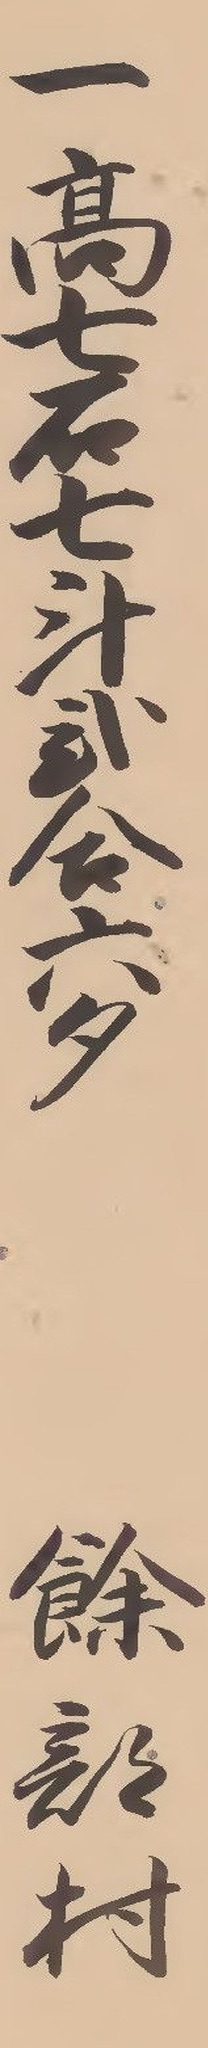一高七石七斗弐合六勺余部村
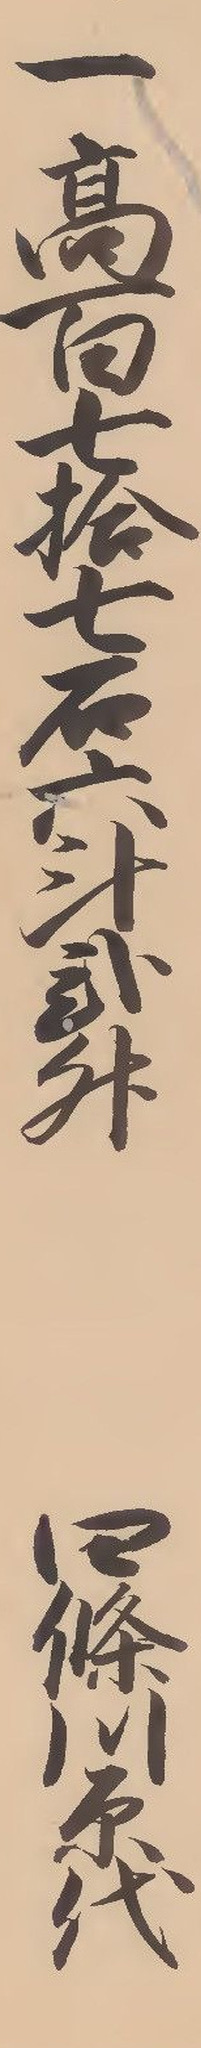一高百七拾七石六斗弐升四条川原代

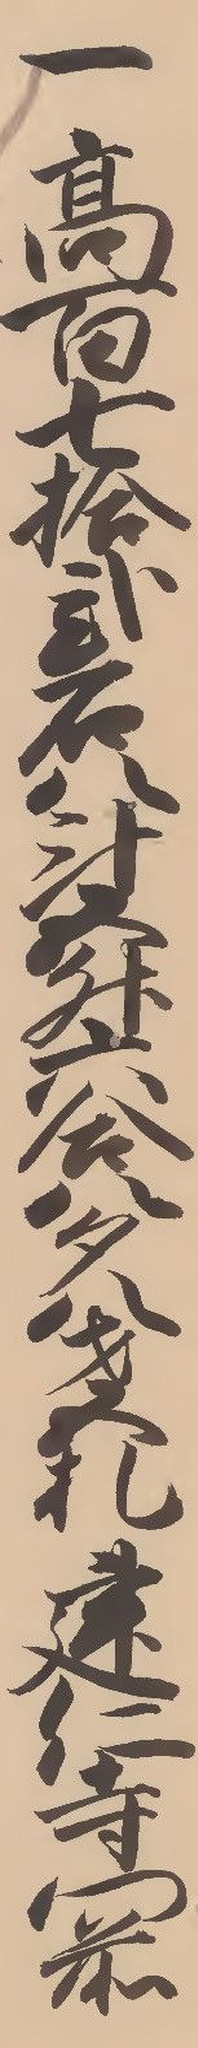一高百七拾弐石八斗五升六合八勺八才五札建仁寺門前
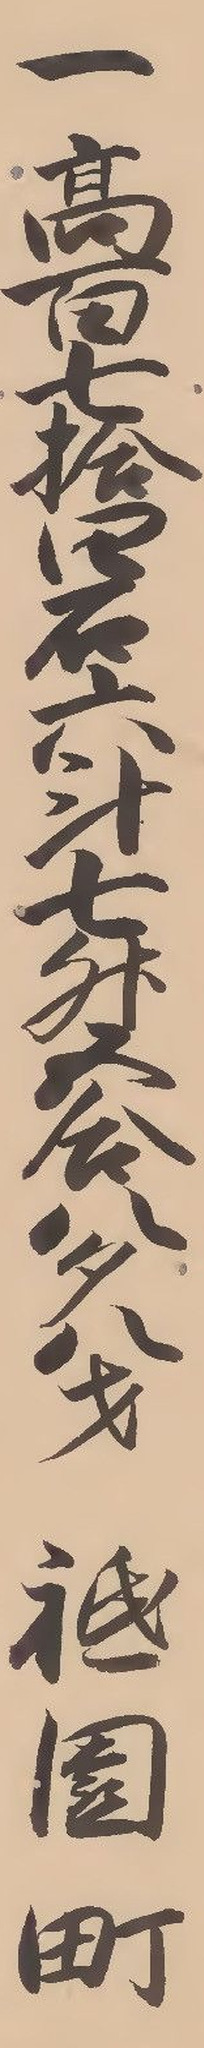一高百七拾四石六斗七升五合八勺八才祇園町
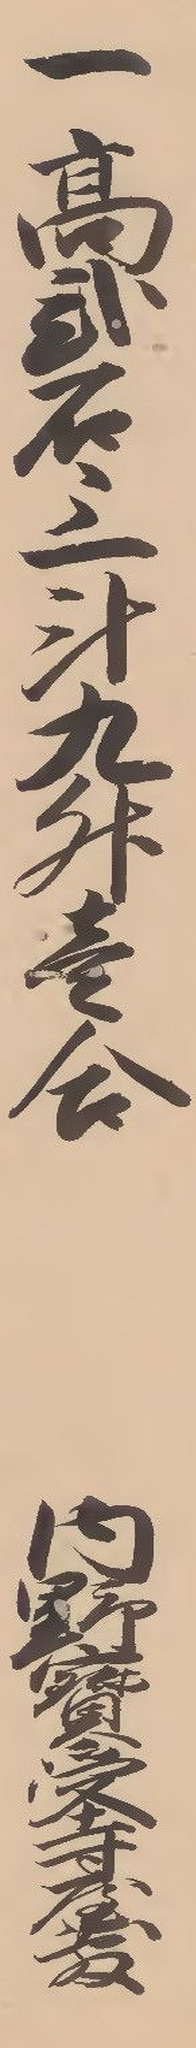一高弐石三斗九升壱合内野宝受寺屋敷
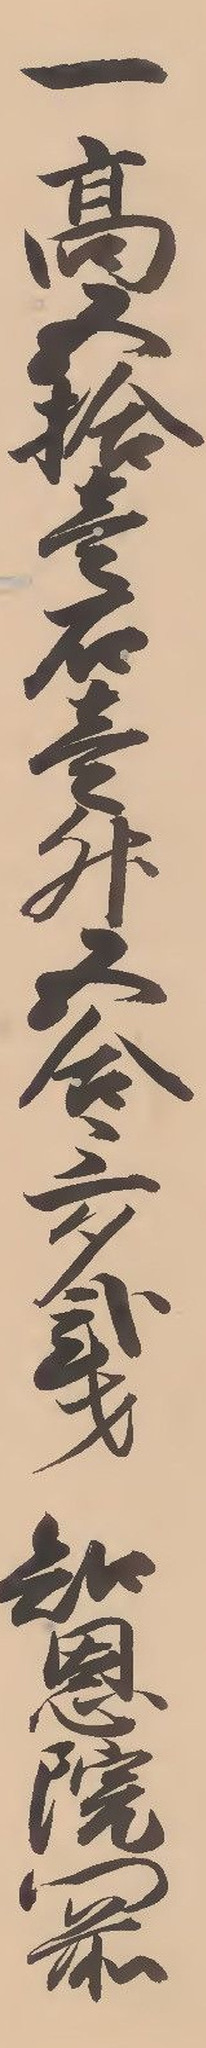一高五拾壱石壱升五合三勺弐才知恩院門前
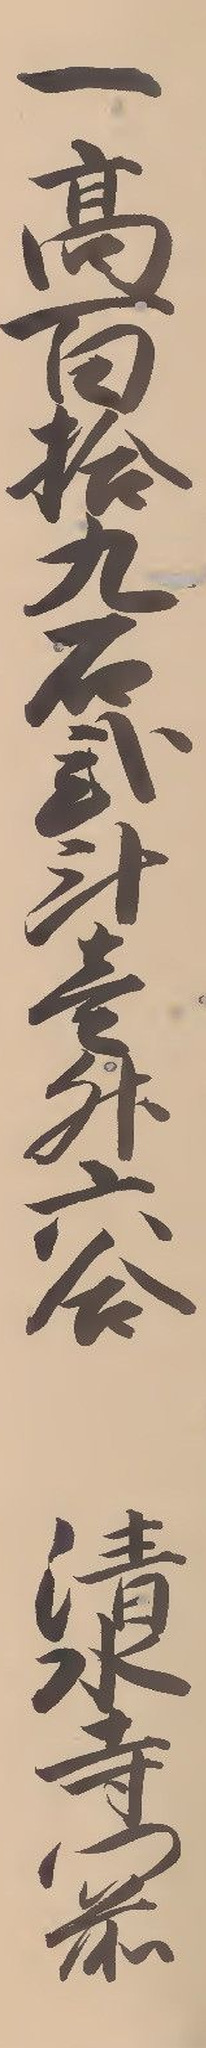一高百拾九石弐斗壱升六合漬水寺門前
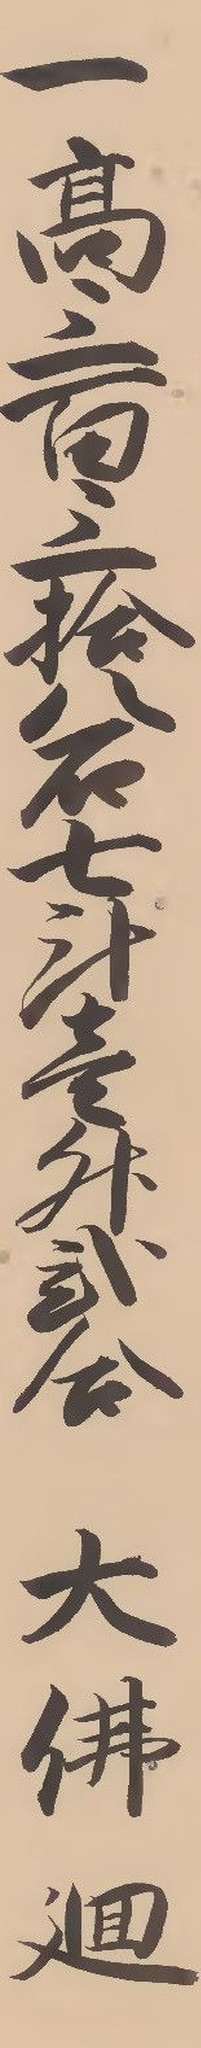一高三百三拾八石七斗壱升弐合大仏廻
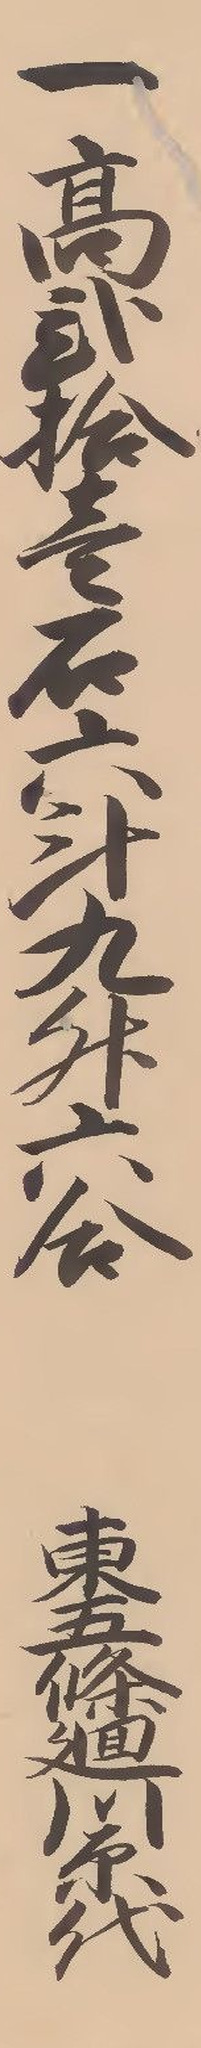一高弐拾壱石六斗九升六合東五条廻川原代

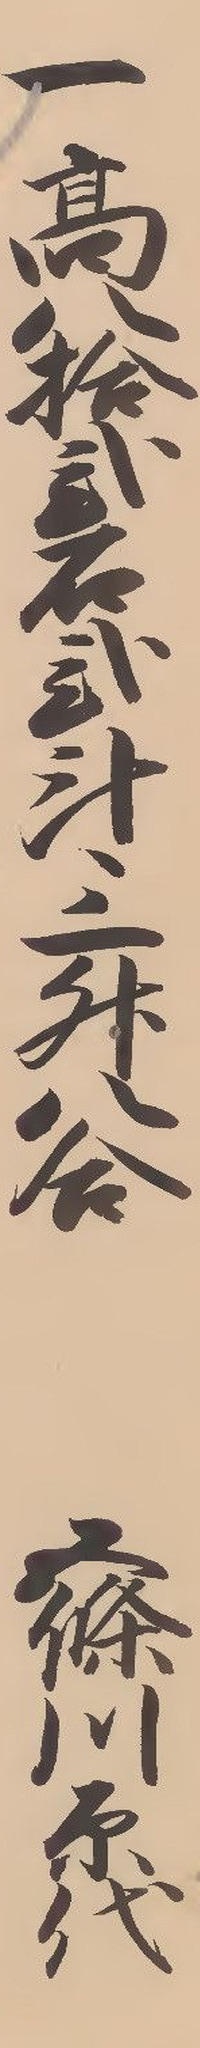一高八拾弐石弐斗三升八合五条川原代
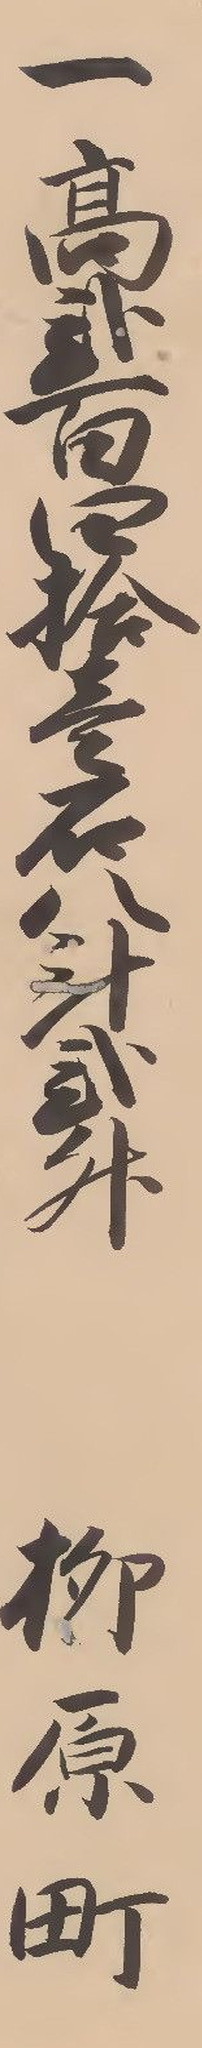一高弐百四拾壱石八斗弐升柳原町
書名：山城国郷帳
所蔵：国立公文書館 National Archives of Japan
